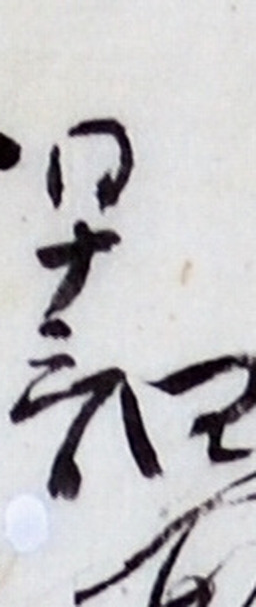同十三日
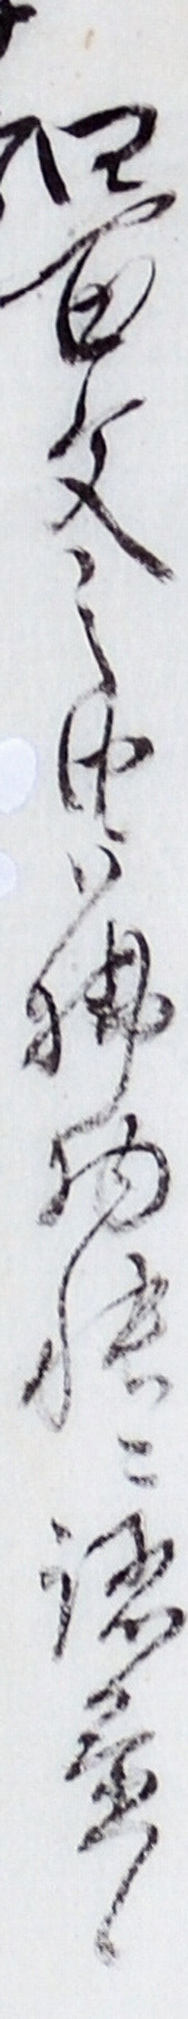四百文之由御払物帳ニ認置候
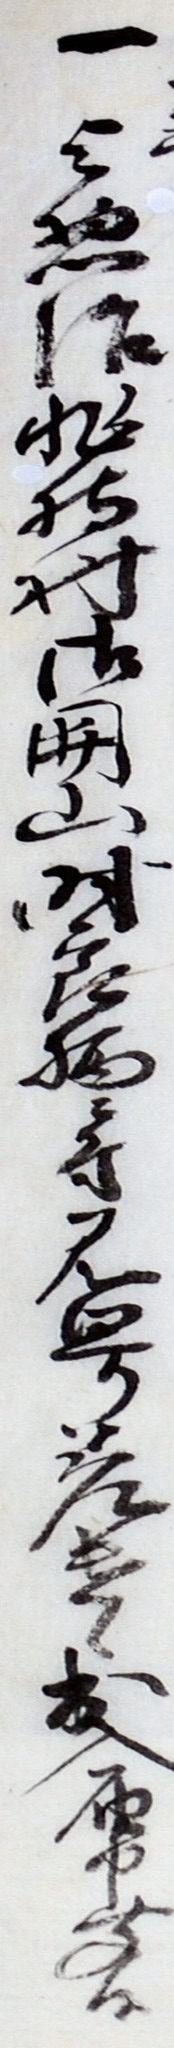一与惣治非持村御囲山附時節柄ニ付見廻り差遣候出入届申聞候
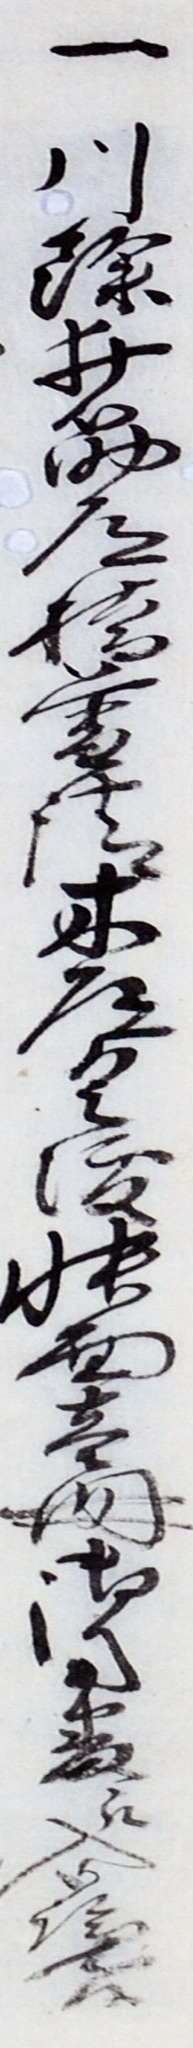一川除井筋道橋普請木道具渡帳面壱冊御用番江入御覧候
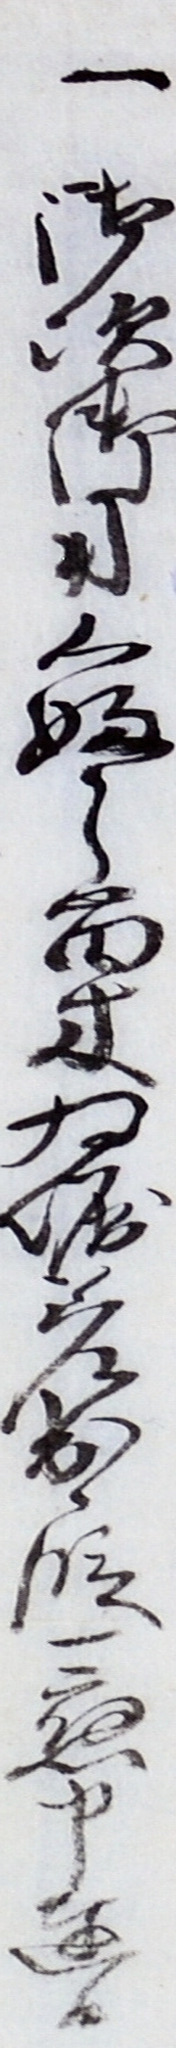一御次御用こふし苗木為堀差出候段一応申達候
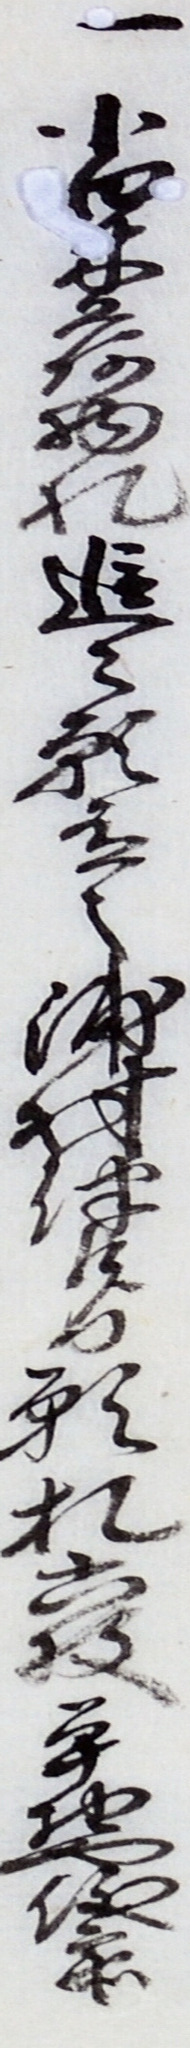一小白木荷物札追々願有之浦村伴左衛門願札六枚平野や儀兵衛
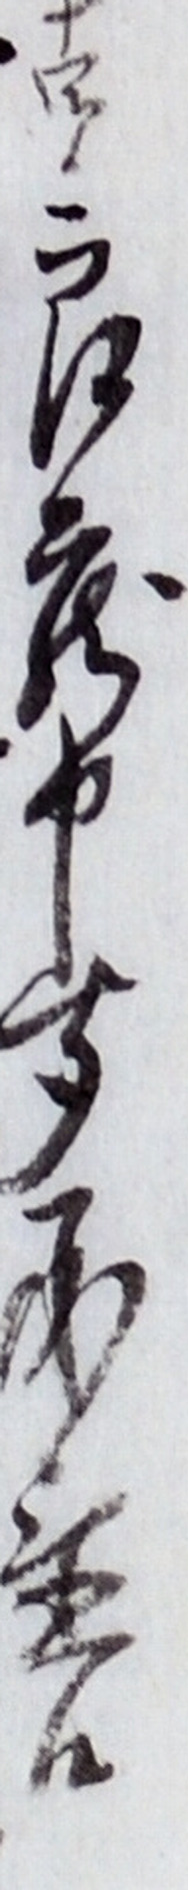良蔵申聞承置候
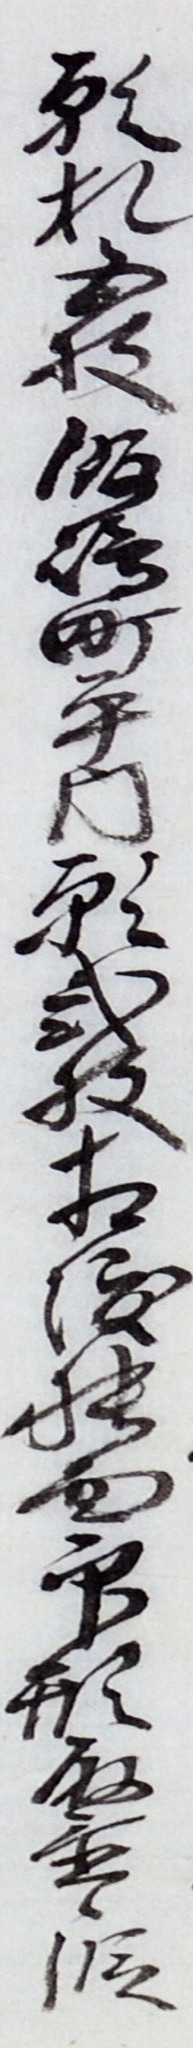願札五枚飯嶋町平内願弐枚相渡帳面印形取置候段
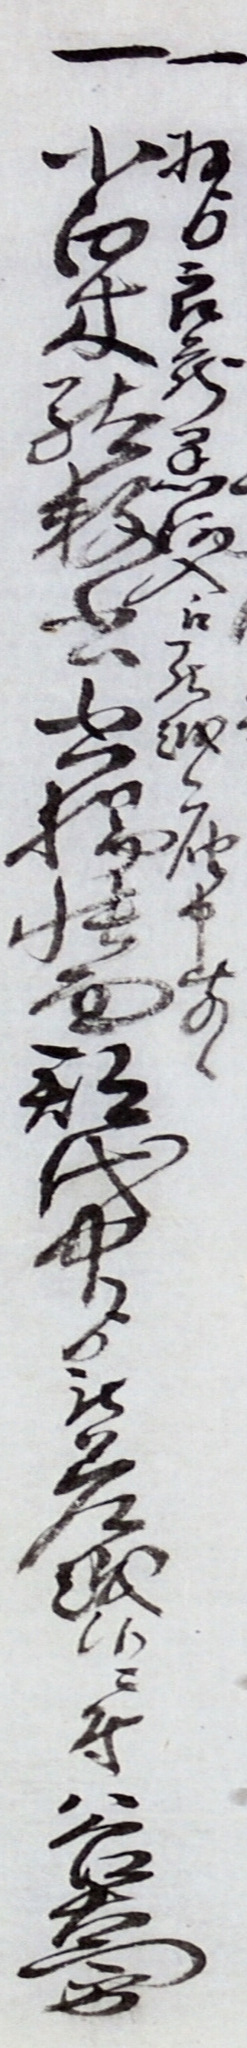一小白木駄数書書揚帳面郡代中ゟ被差越候ニ付善右衛門方
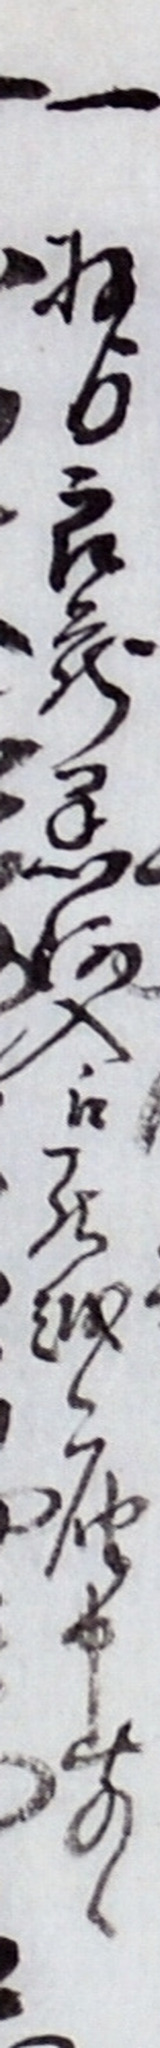一羽右衛門良蔵黒河入江罷越候届申聞候
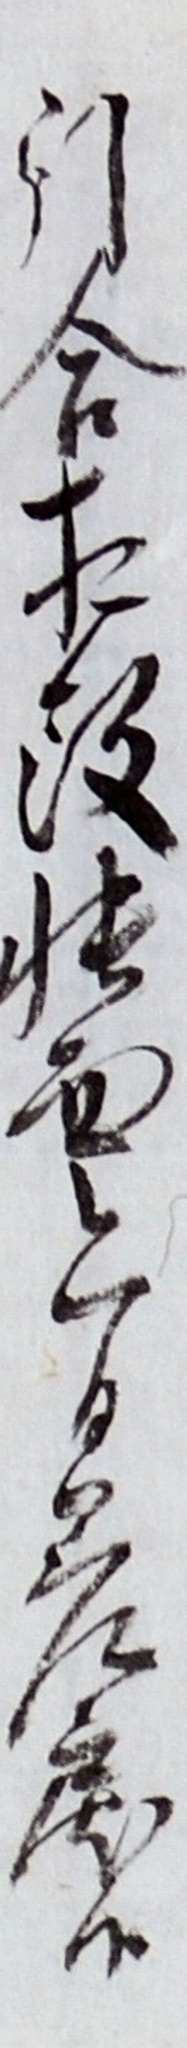引合相改帳面今日差戻候
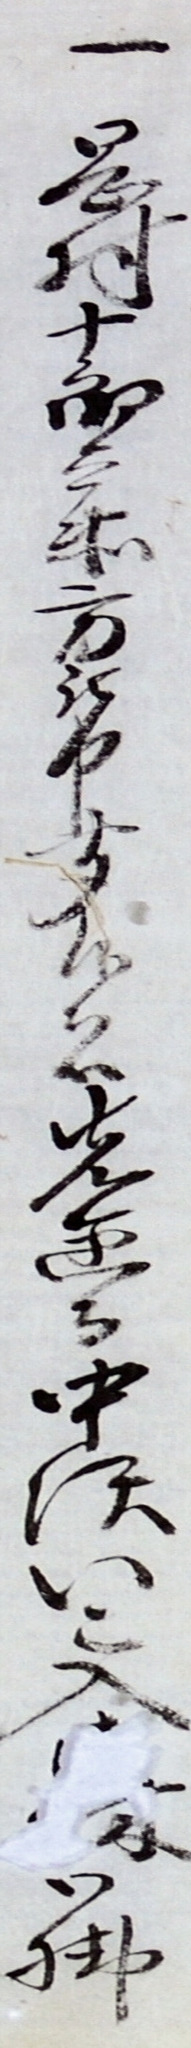一岡村十郎兵衛方被申聞候は先達而中沢いこ入御林御払
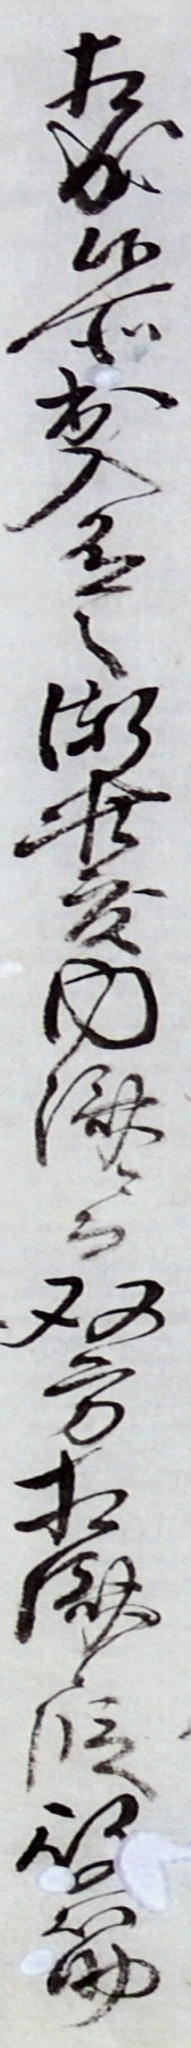相成候所出入有之漸此度内済ニ而双方相済候段役筋
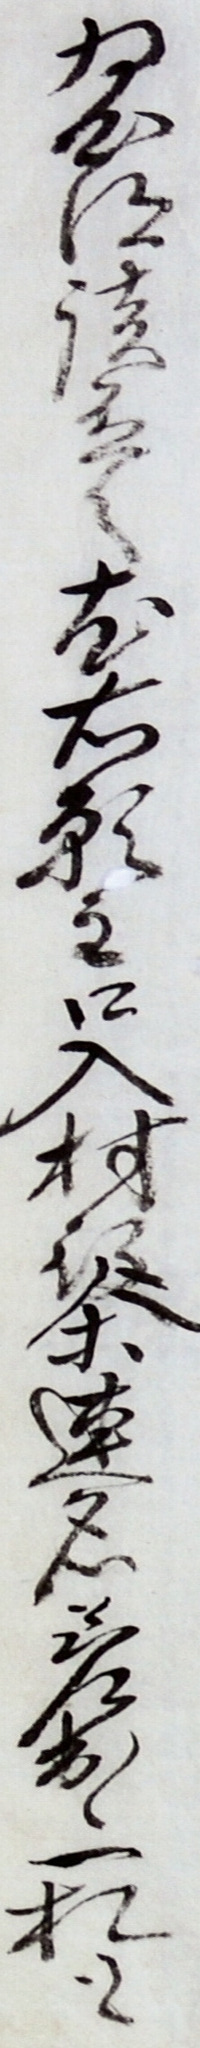為心得談有之尤右願主口入村役人等連名差出候一札も

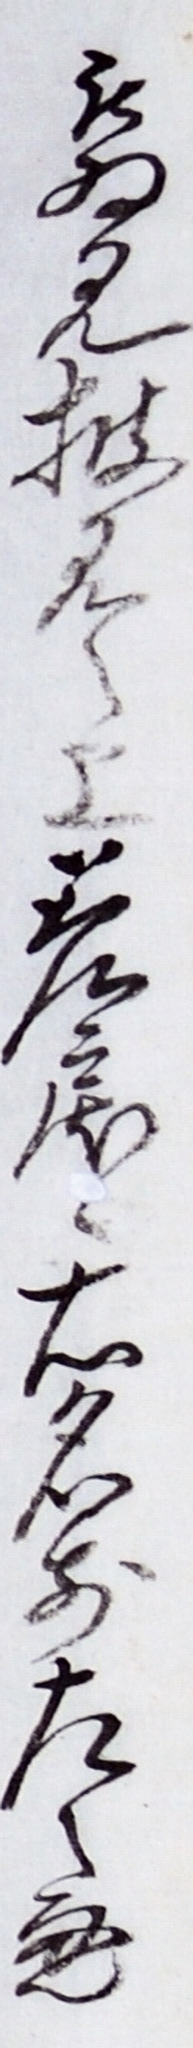被為見披見之上差戻候右名前左之通
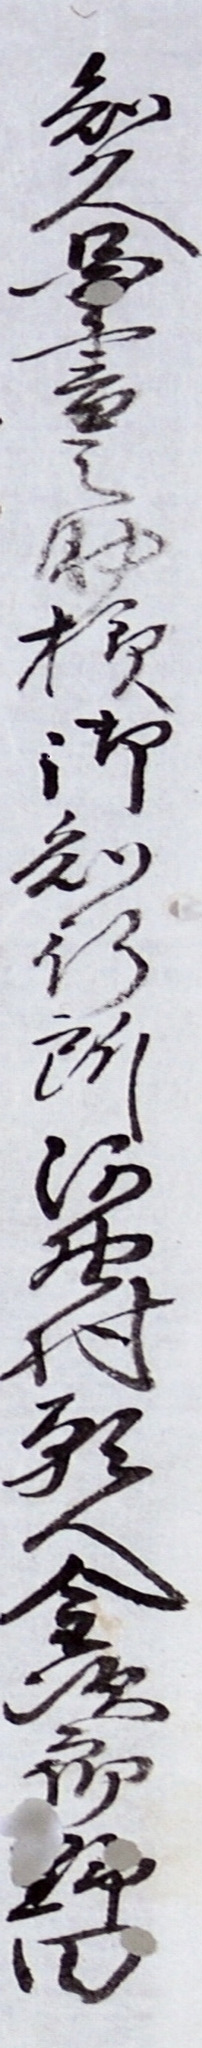知久図書之助様御知行所河野村願人金次郎野田
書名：御山奉行御用控
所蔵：伊那市立高遠町図書館・合同会社AMANE
